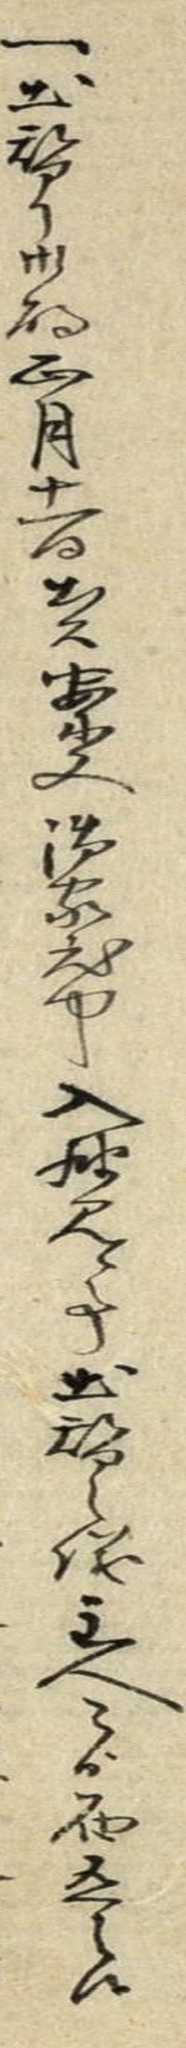一出替り御触正月十一日出す案文御家老中入披見候事出替之儀主人々ゟ届有之候
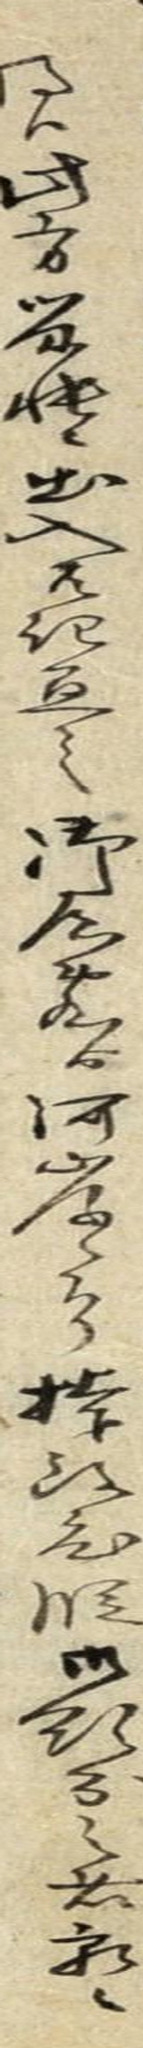得は此方留帳に出入共記置之御屋敷ゟ河岸へ下り挊致度段御領分之者願候
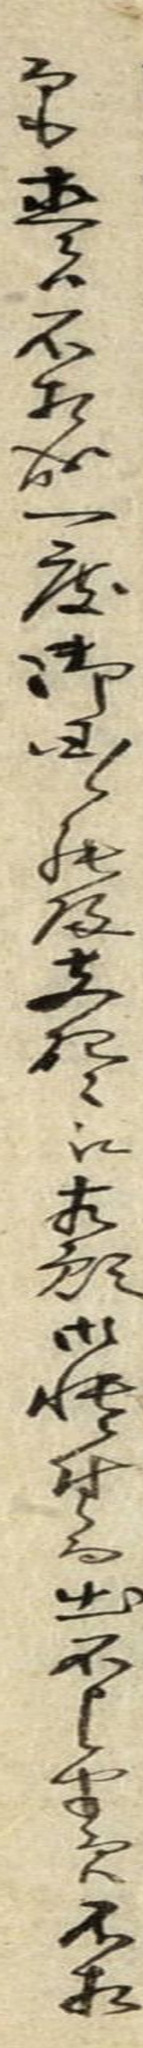ても直には不相成一度御国へ罷帰支配々江相願御帳に付候て出不申候半ては不相
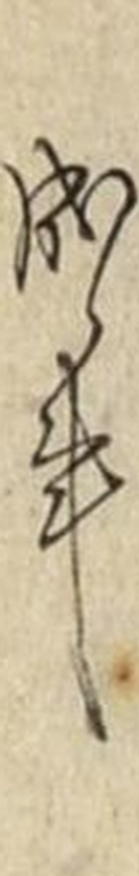成候事

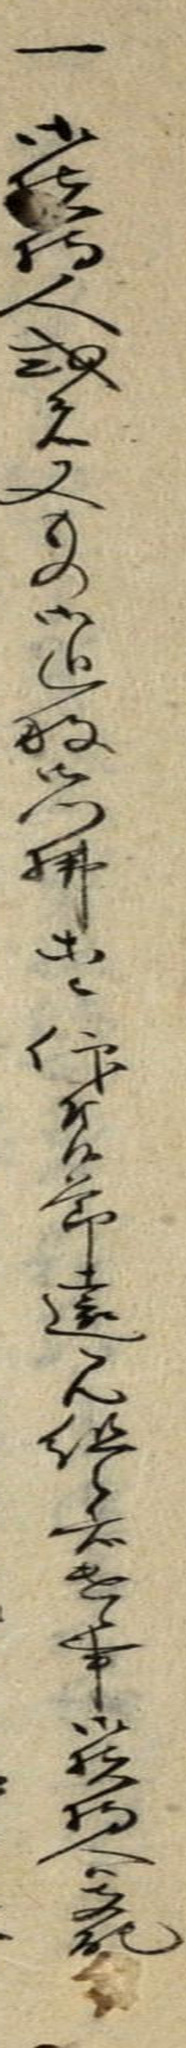一御扶持人或は又もの御追放御門払等被仰付候節遠見組之者遣候事御扶持人は支配
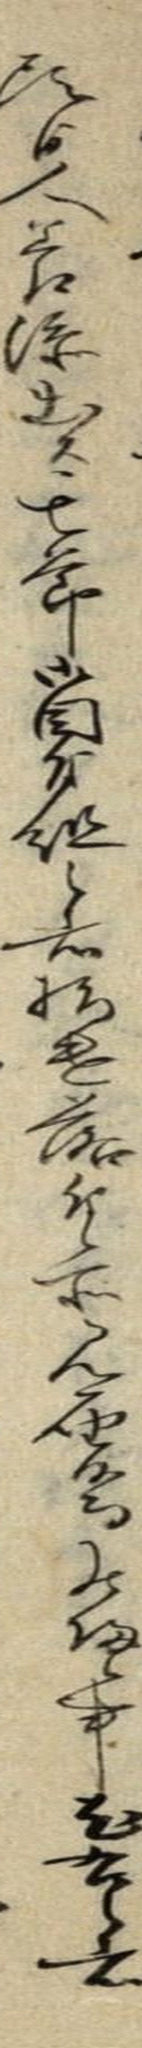頭ゟ人差添出す其節御目付組之者指遣落付候所見届候て罷帰候事尤右之者
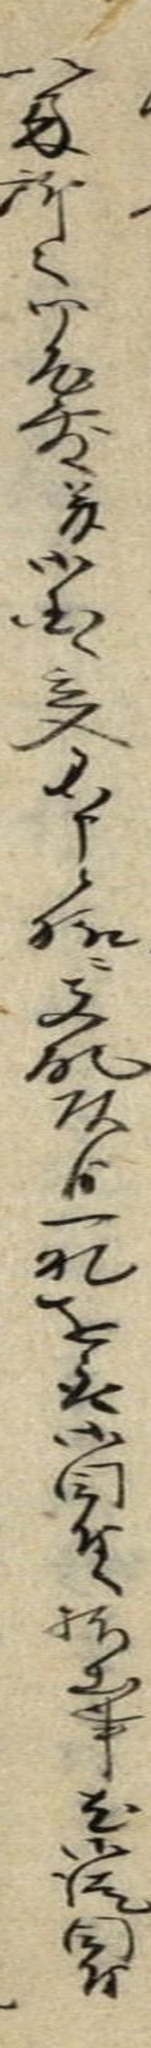以来所之御屋敷并御国へ立入不申候様に支配頭ゟ一札を取御目付へ指出事尤御徒目付
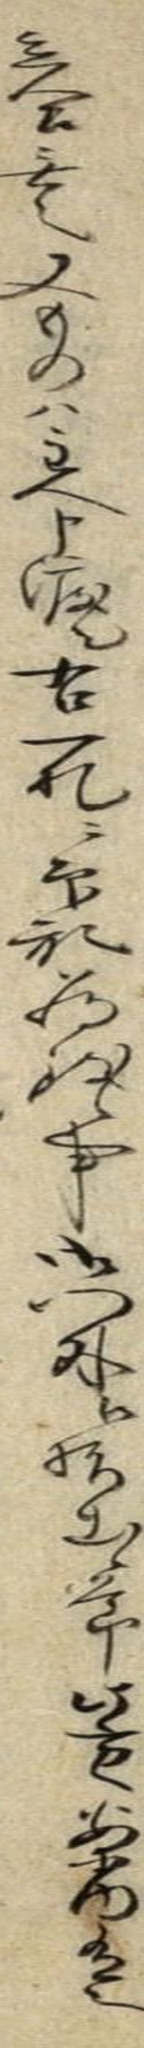立合無之又ものは主人申渡し右一札に印形為致候事御門外江指出候節此方へ案内有之
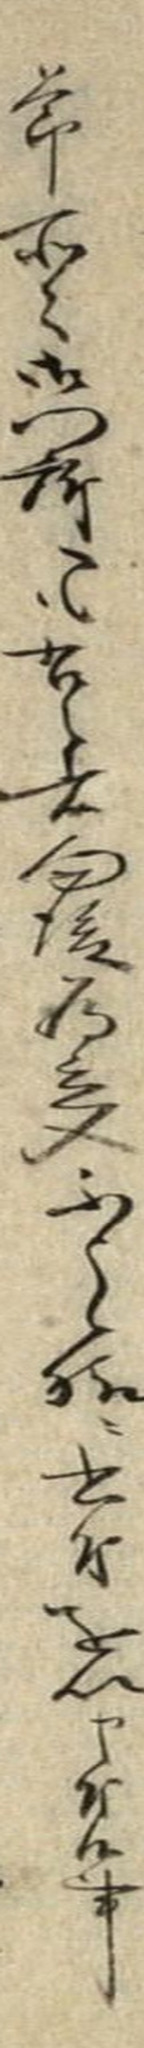節所々御門所へも右之者向後為立入不申候様に書付を以申付候事
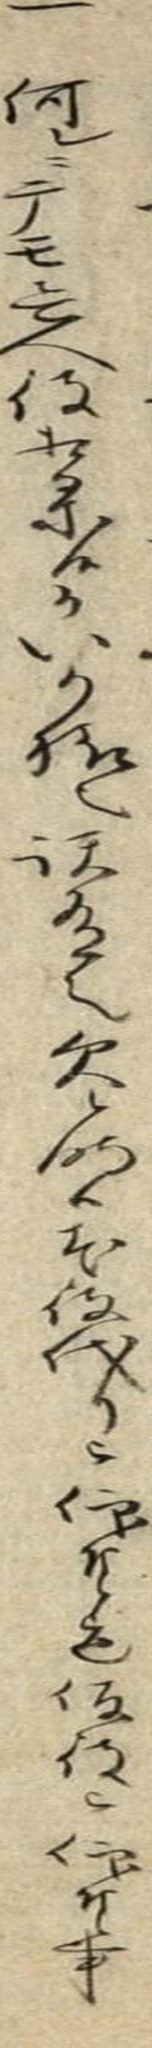一何れにても壱人役相果候かいか用之訳有之欠候時は本役代りに被仰付候迄仮役被仰付候事
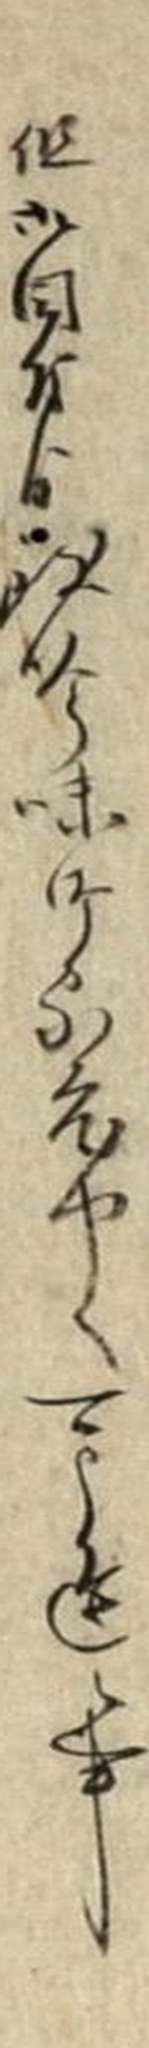但御目付ゟ致吟味御家老中へ可申達候事
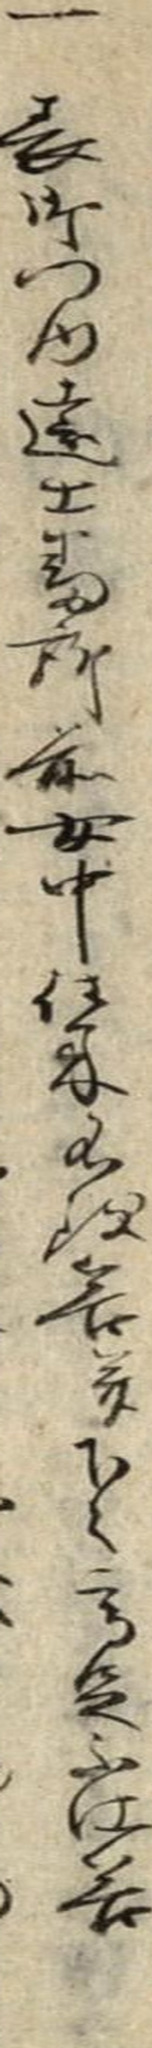一表御門内遠出番所前女中往来不致筈并下々高足不仕筈
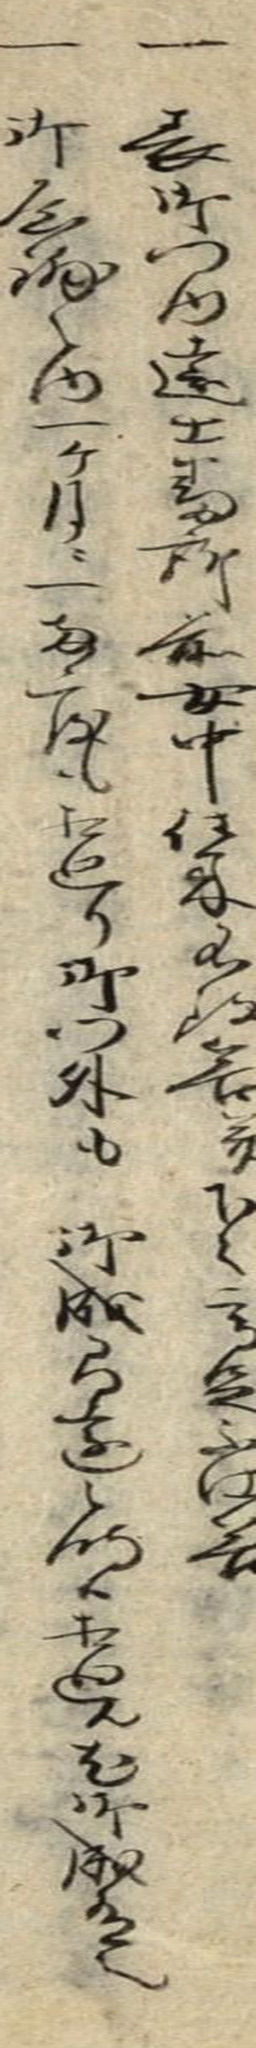一御屋鋪之内一ケ月に一両度も相廻り御門外も御成間遠之時は相廻る尤御成之
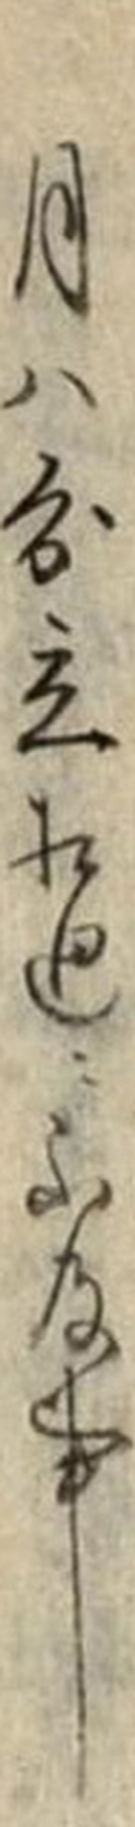月は分立相廻に不及事
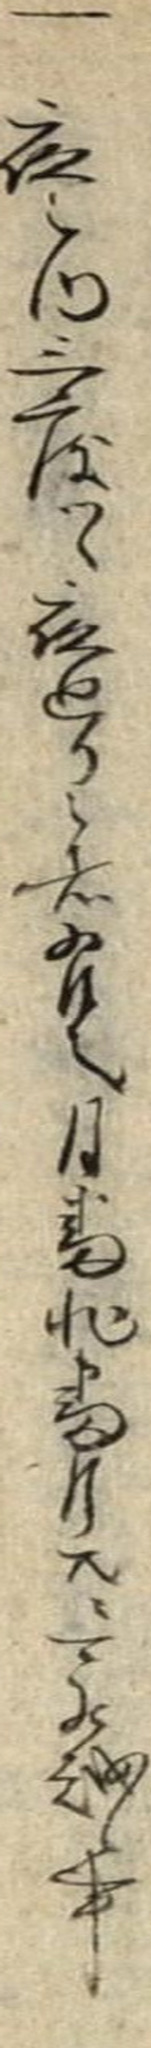一夜之内三度つゝ夜廻り之者有之月番非番月共に可罷越候事
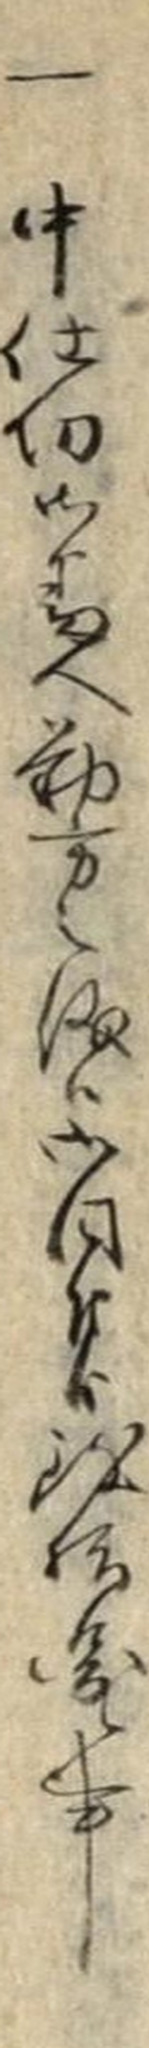一中仕切御番人勤方之儀は御目付ゟ致指図候事
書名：三都并道中之部
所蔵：福井県文書館 Fukui Prefectural Archives
